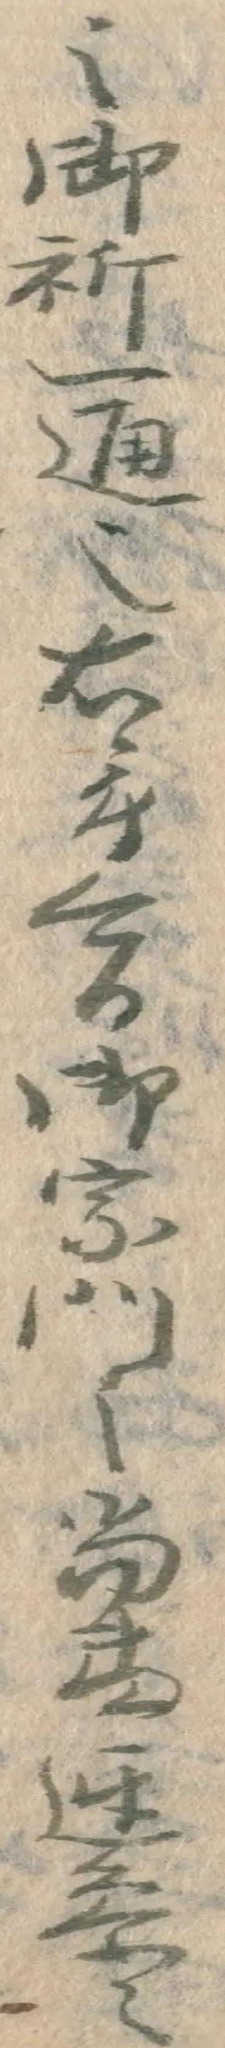之御祈一通也、右ニ付今日御家門之當番遅参之

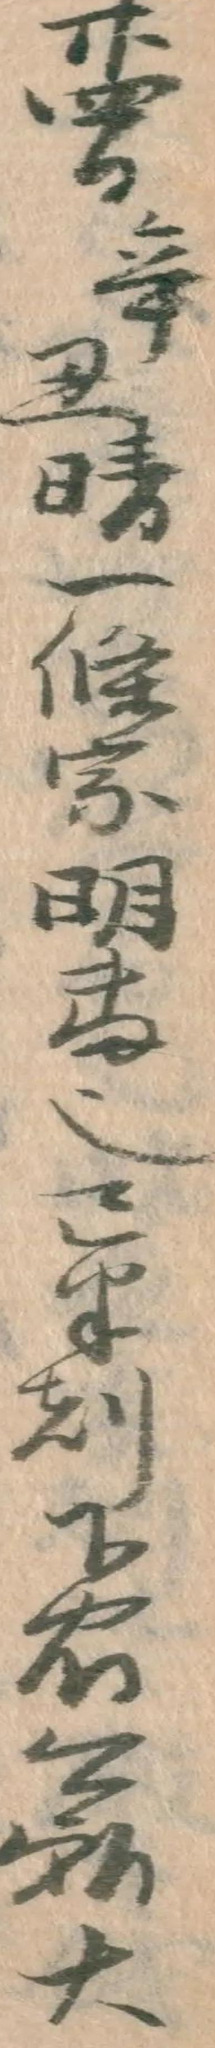廿四日辛丑晴、一條家明番也、巳半刻下宿、今朝大
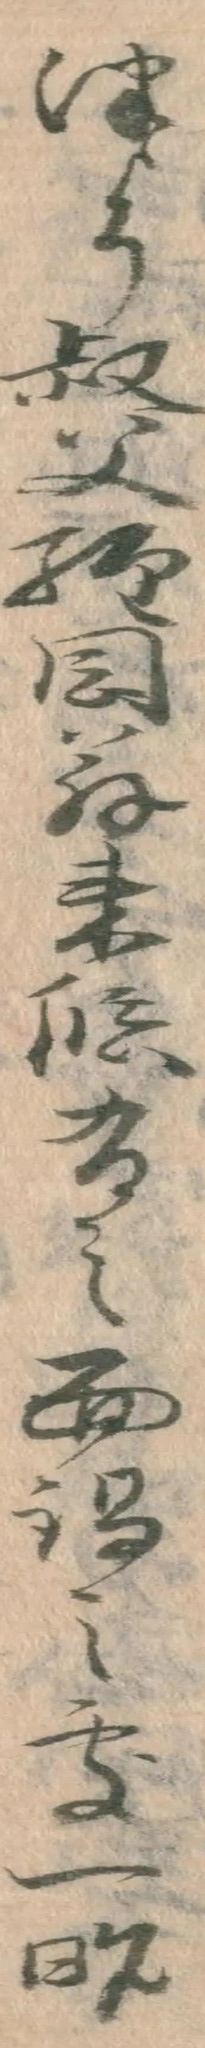津より叔父経岡翁来臨有之、面謁之處、一昨
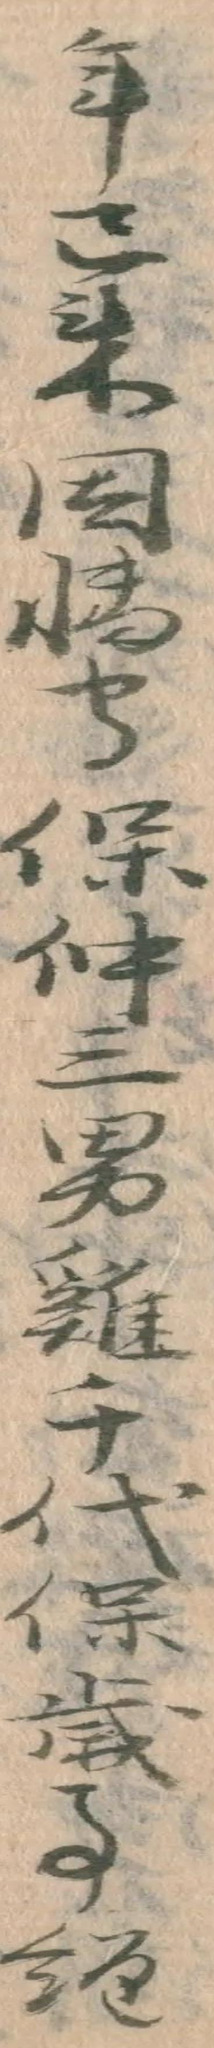年巳来因幡守保仲三男鶏千代保歳事、経
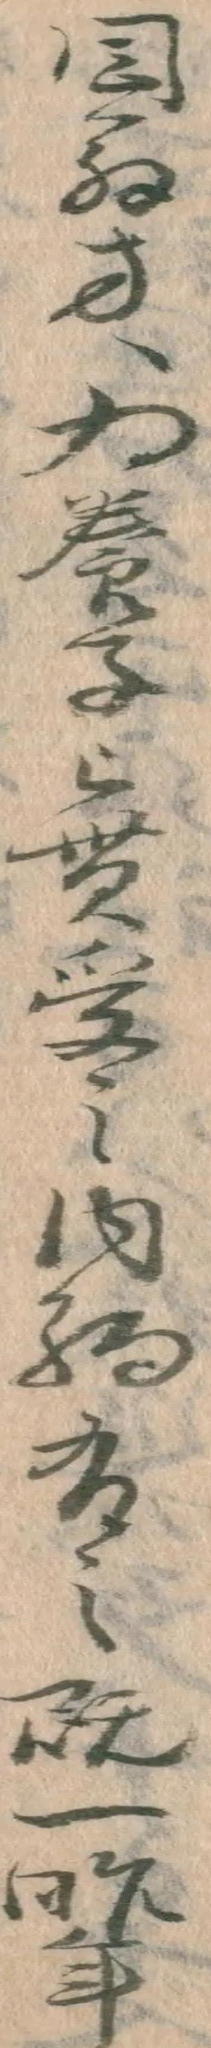岡翁方へ為養子被貰受之内約有之、既一昨年
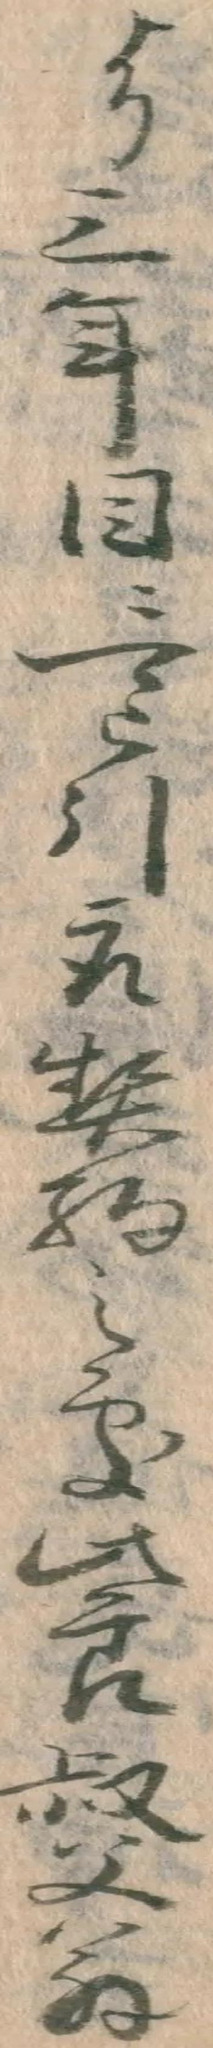より三年目ニ可被引取契約之處、此節叔父翁
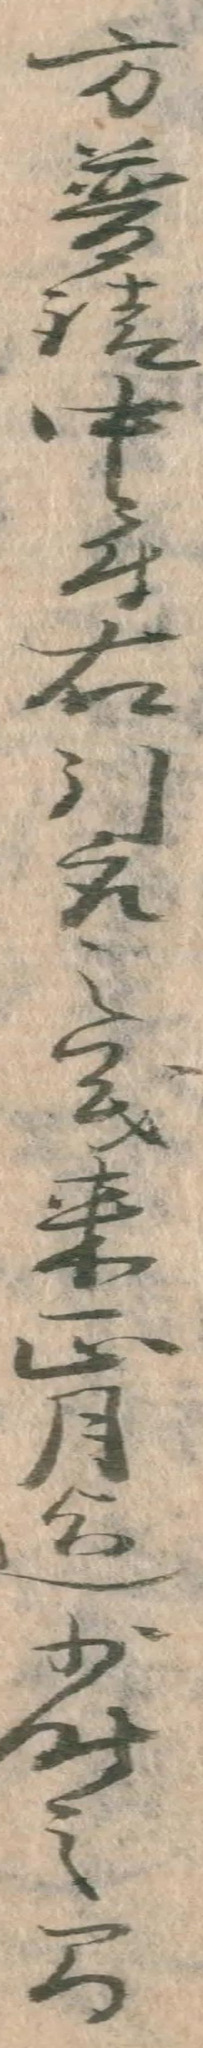方普請中ニ付、右引取之義来正月迄少時之間
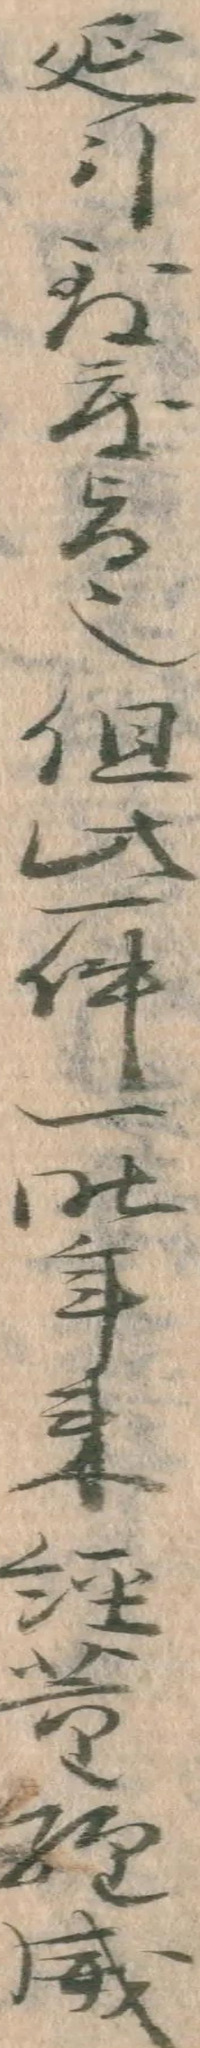延引致度旨也、但此一件一昨年来経董・経威・
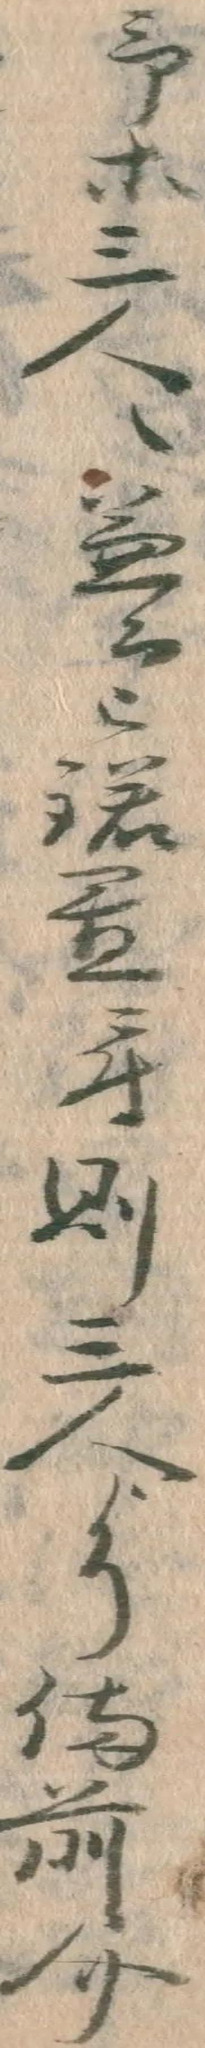予等三人へ兼而被譲置ニ付、則三人より備前介
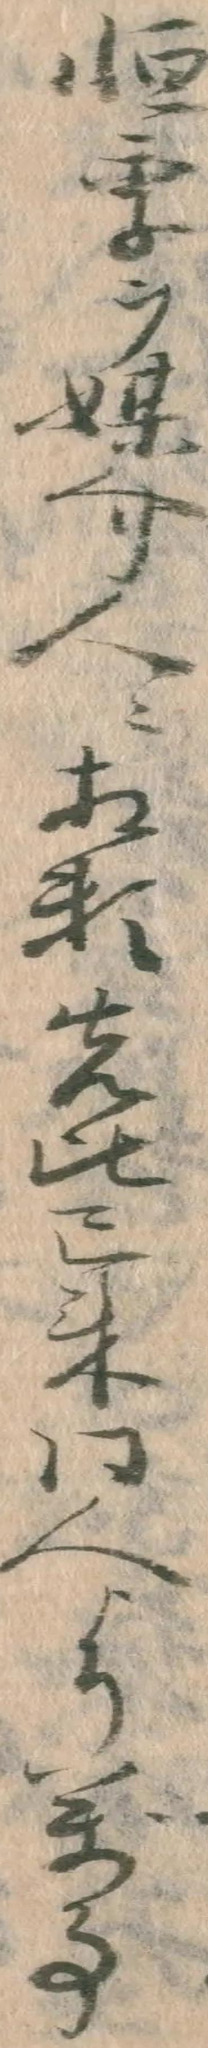恒季ヲ媒介人ニ相頼、先此已来同人より萬事
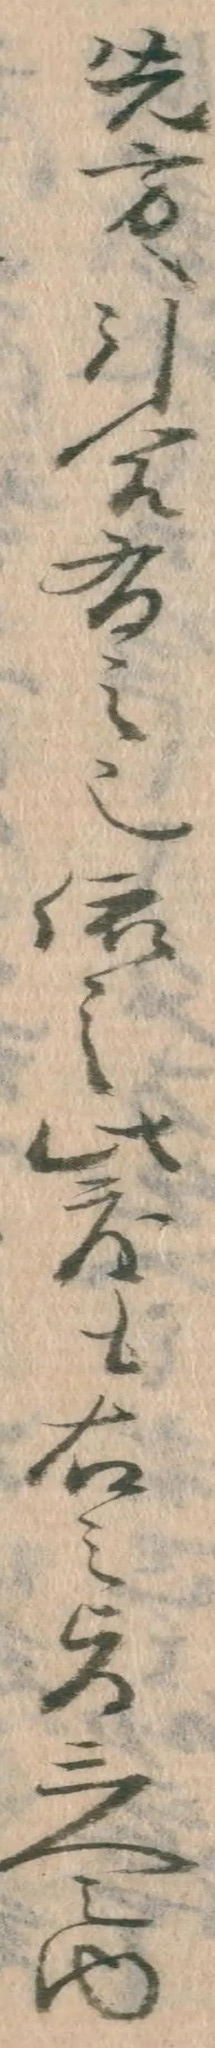先方へ引合有之也、依之此度も右之旨三人之内
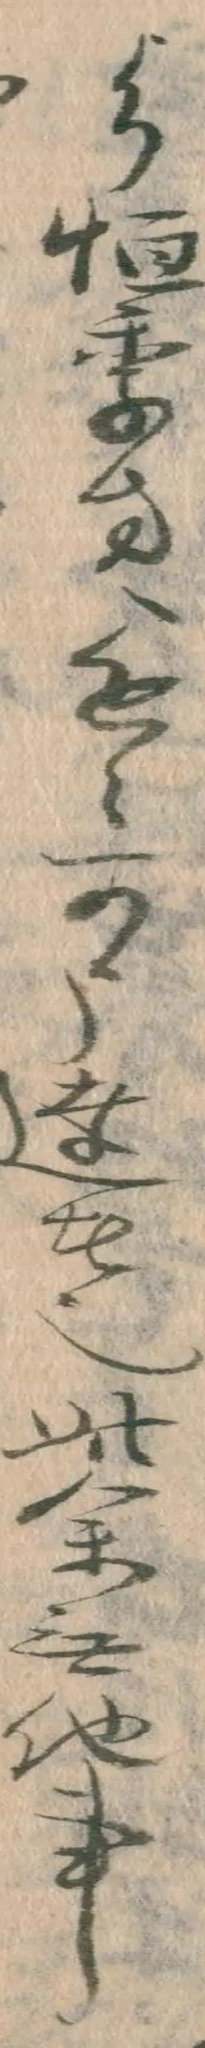より恒季方へ近々可申達者也、此余無他事、
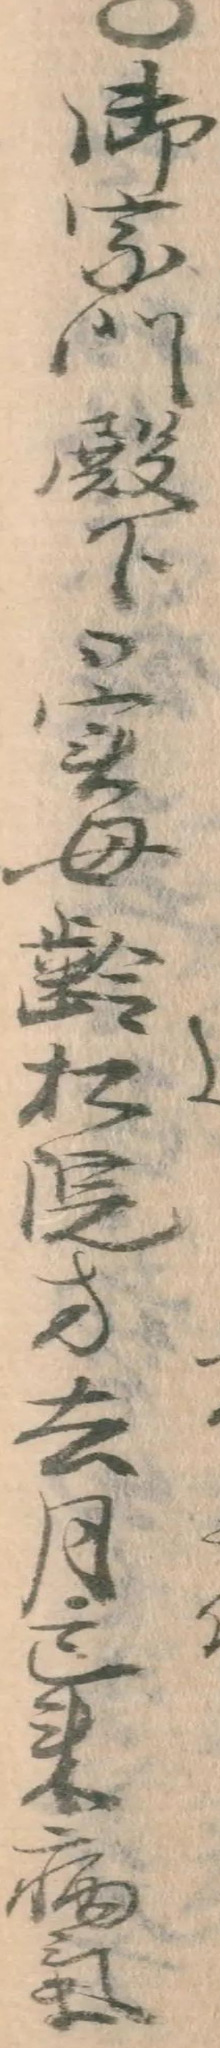○御家門殿下御実母齢松院方、去月已来病気
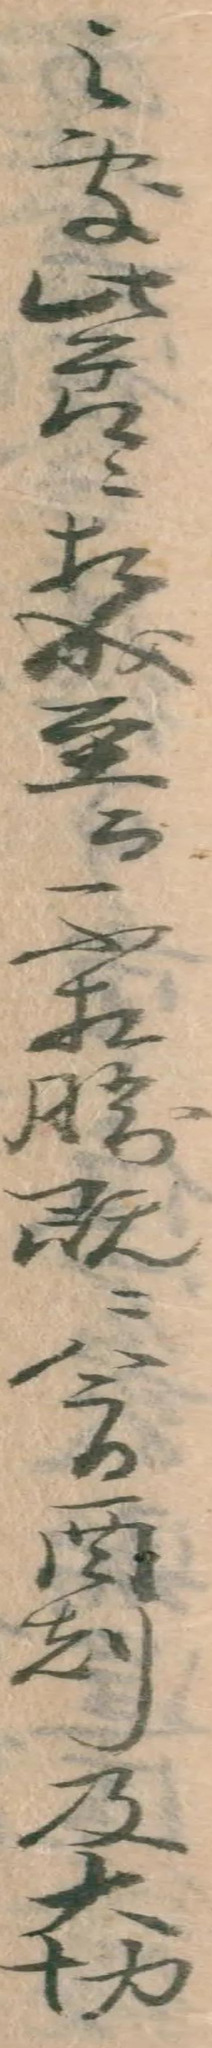之處此節に相成至而不相勝、既ニ今日酉刻及大切
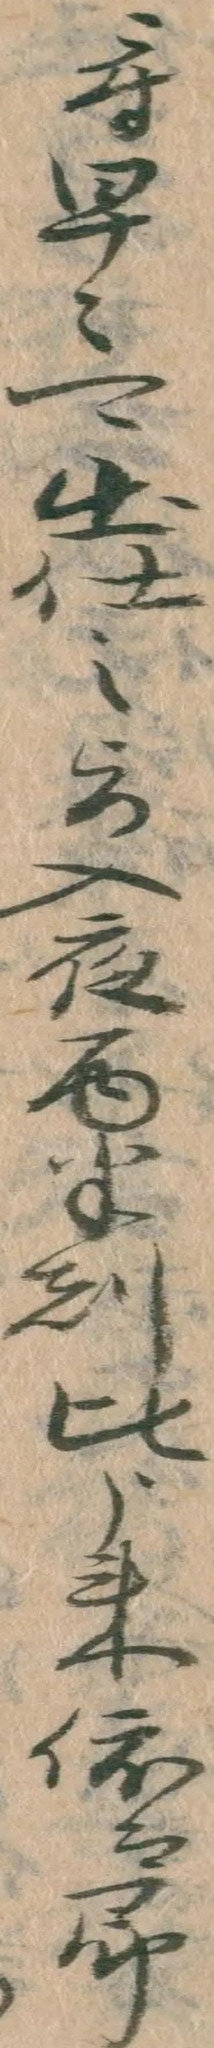ニ付早々可出仕之旨、入夜酉半刻比申来、依而即
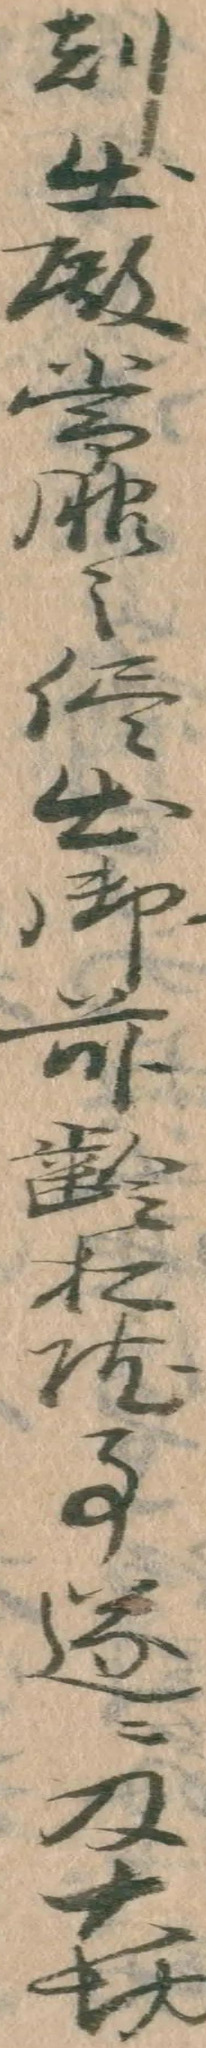刻出殿、常服之侭出御前、齢相就事遂に及大切
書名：賀茂社記録. 第63冊
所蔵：国立国会図書館 National Diet Library, JAPAN
